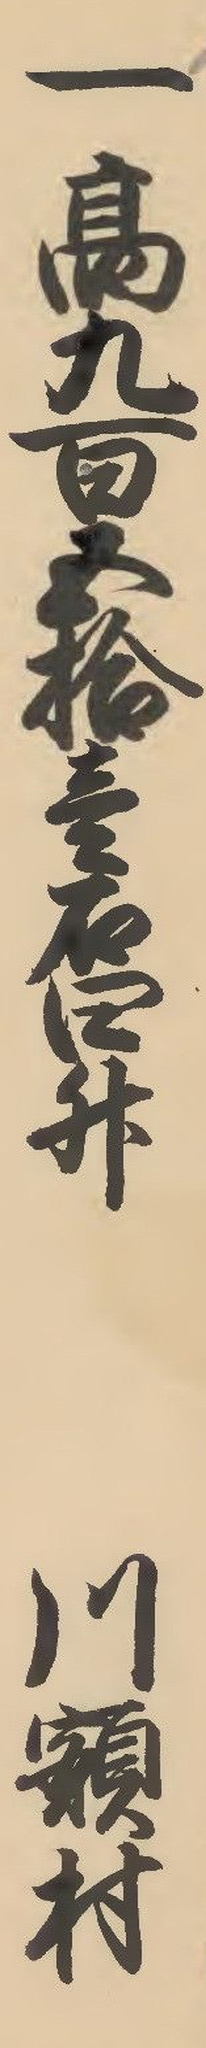一髙九百五拾壱石四升川額村
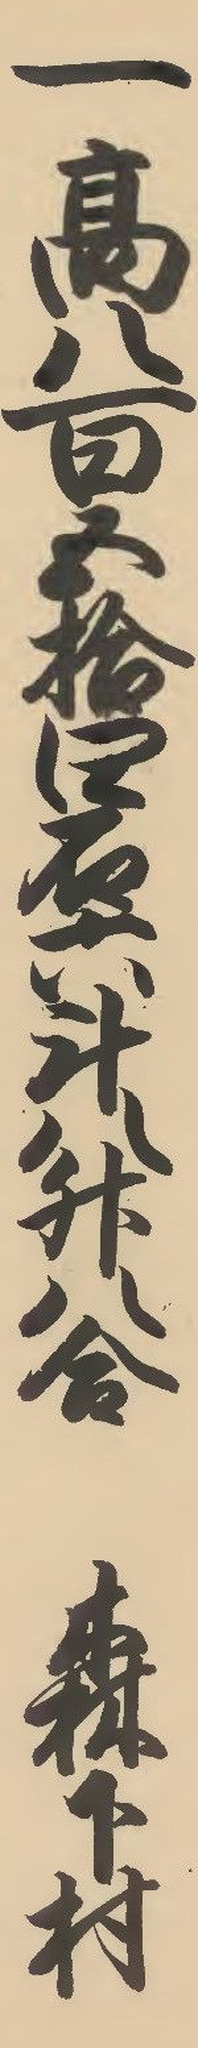一髙八百五拾四石六斗八升八合森下村
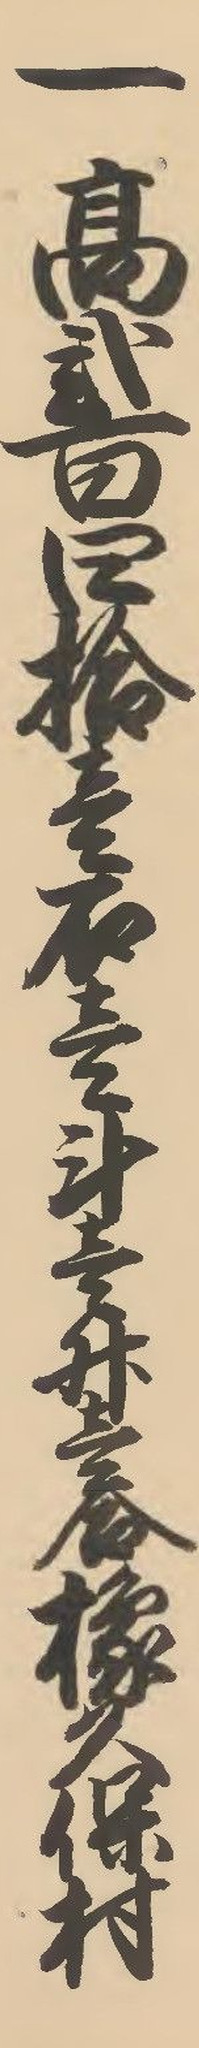一髙弐百四拾壱石壱斗壱升壱合橡久保村
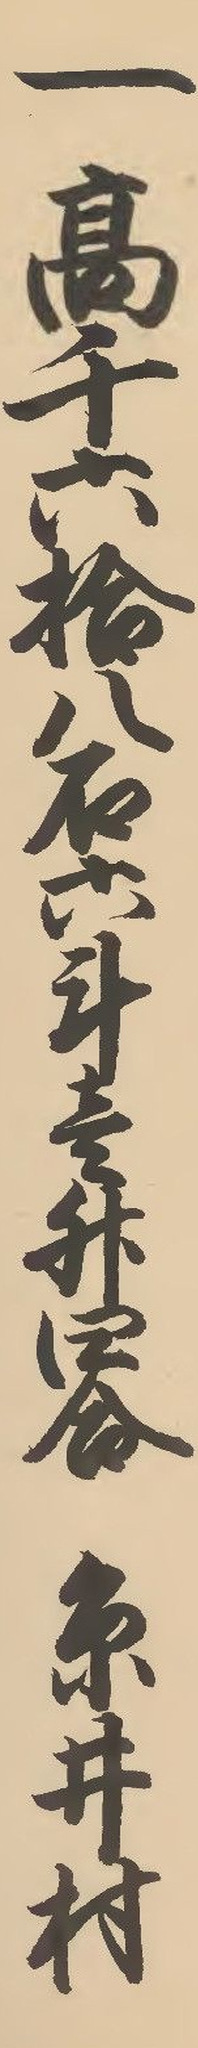一髙千六拾八石六斗壱升四合糸井村
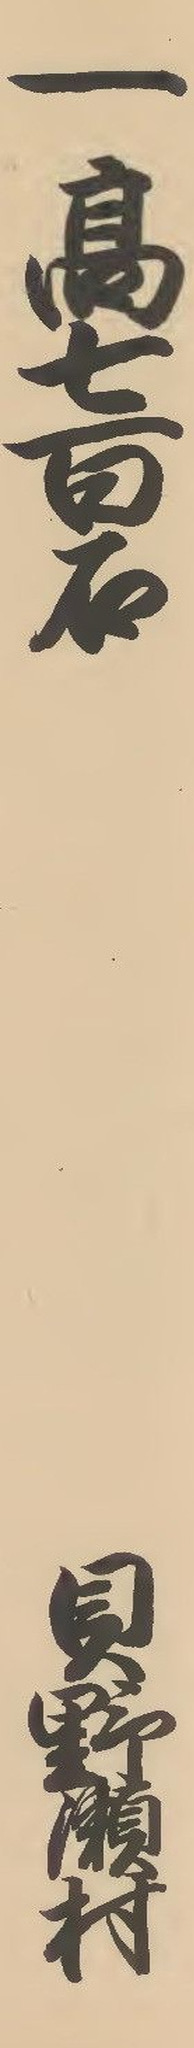一髙七百貝野瀬村
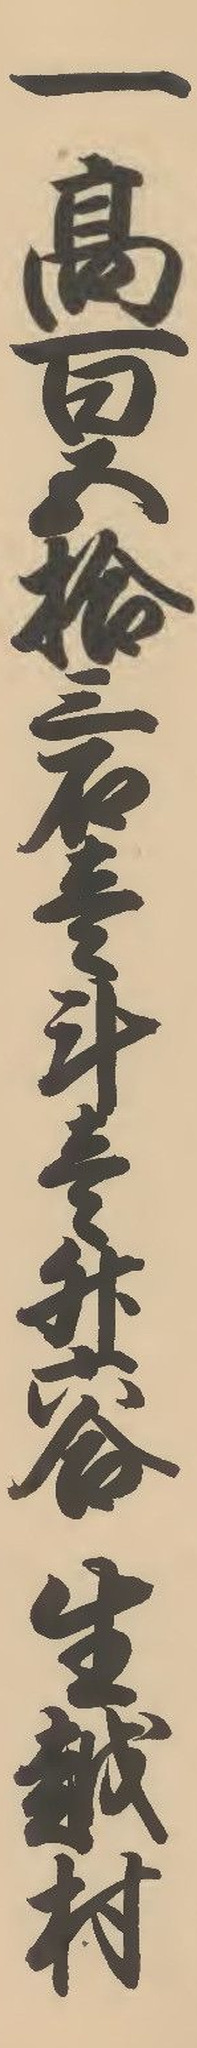一髙百五拾三石壱斗壱升六合生越村
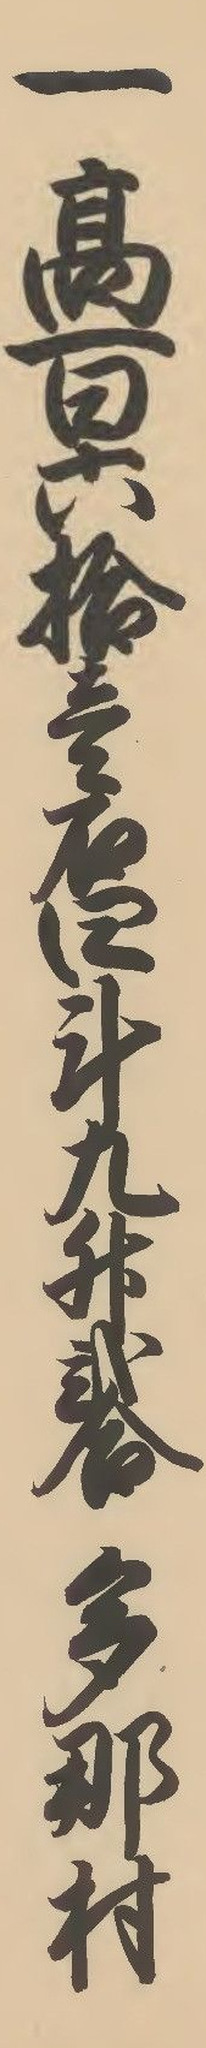一髙百六拾壱石四斗九升弐合多那村
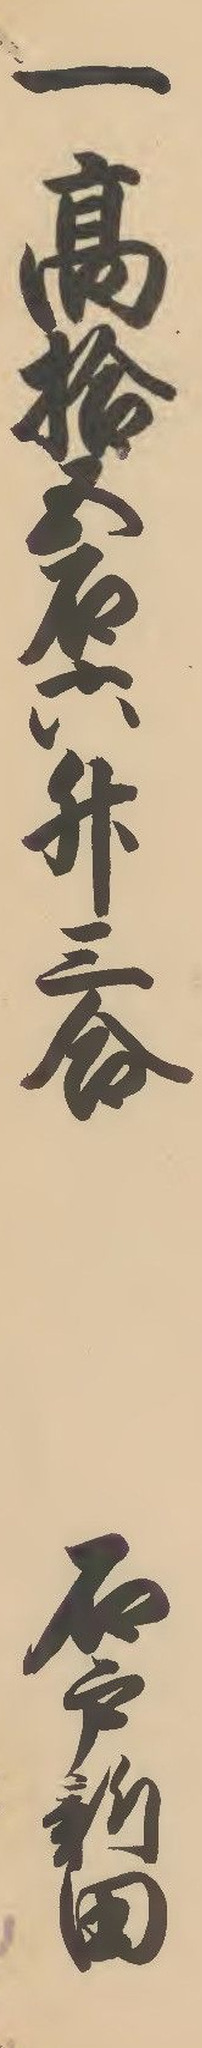一髙拾五石六升三合石戸新田

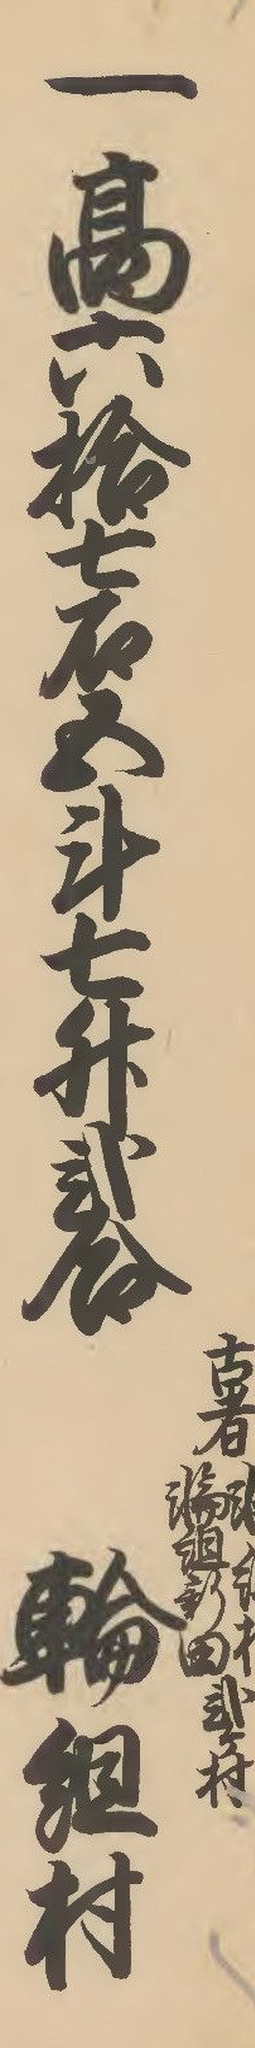一髙六拾七石五斗七升弐合輪組村
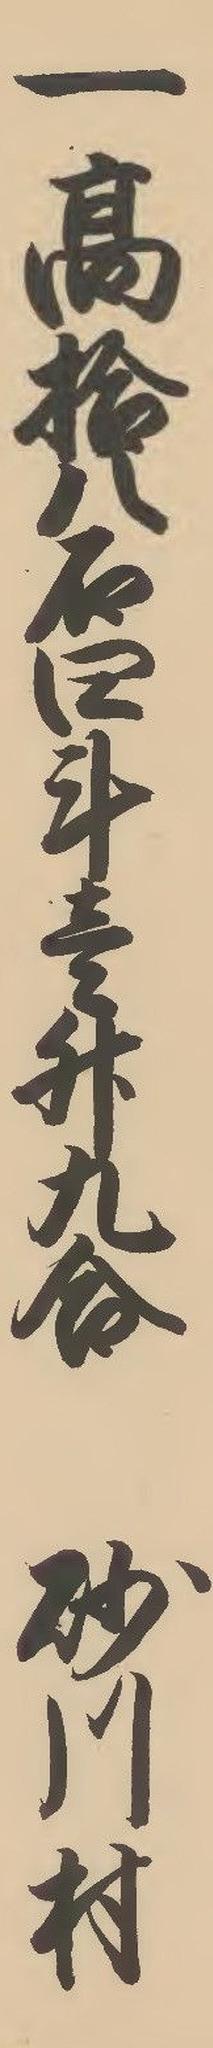一髙拾八石四斗壱升九合砂川村
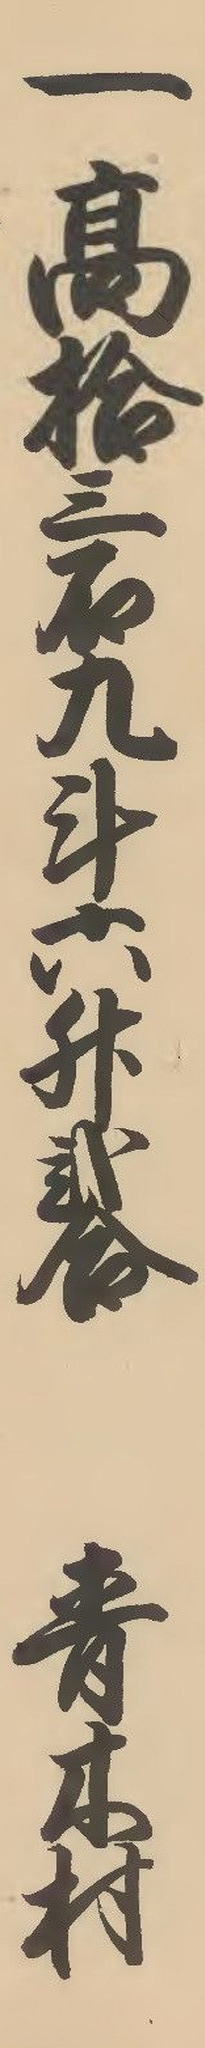一髙拾三石九斗六升弐合青木村
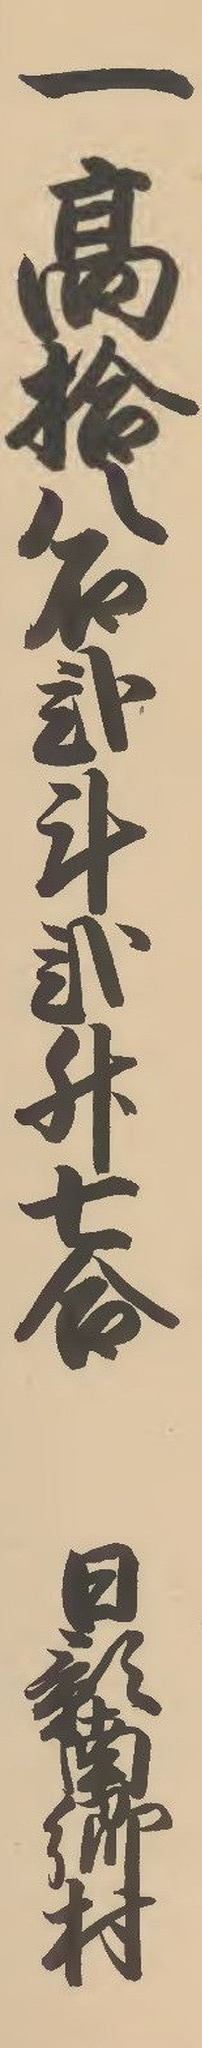一髙拾八石弐斗弐升七合日影南郷村
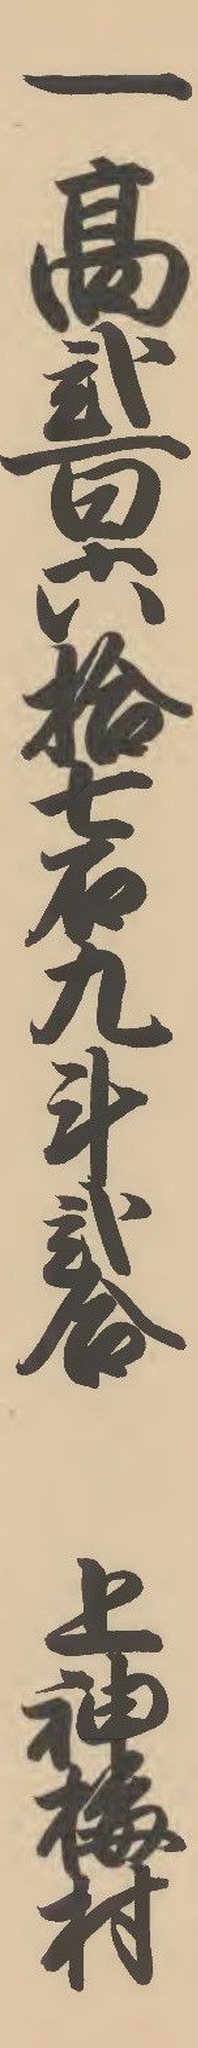一髙弐百六拾七石九斗弐合上神梅村
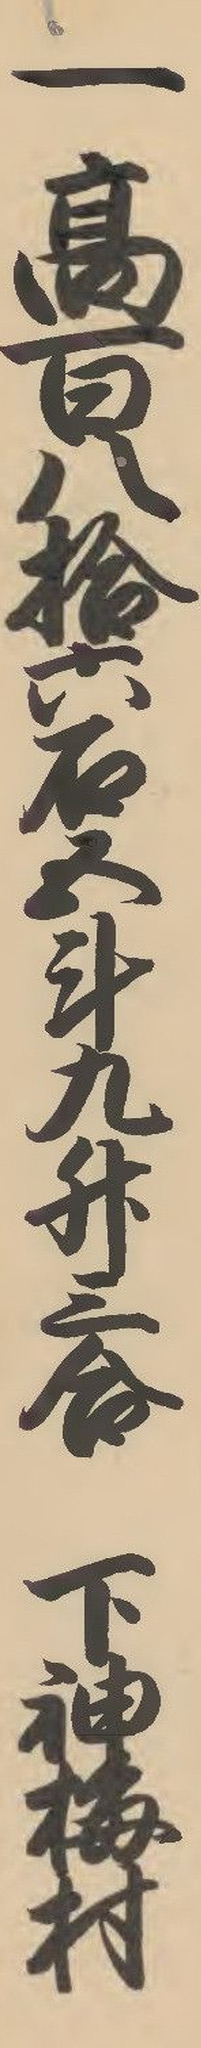一髙百八拾六石五斗九升三合下神梅村

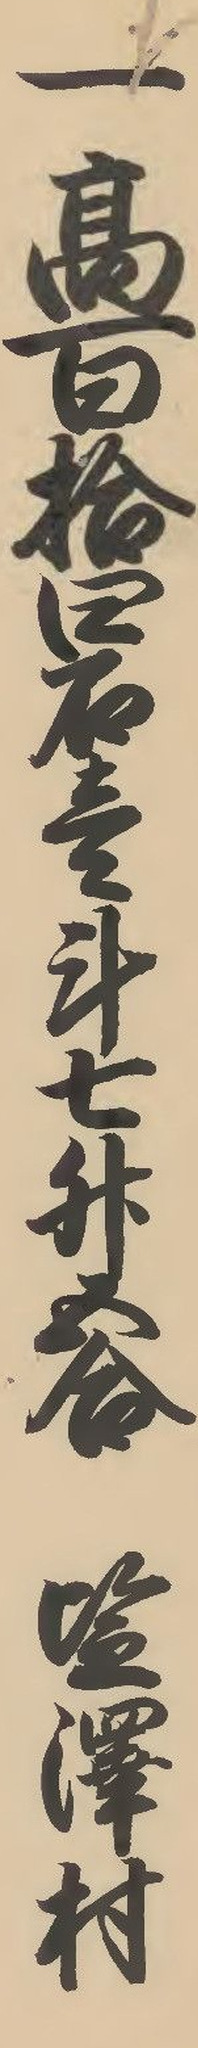一髙百拾四石壱斗七升五合塩澤村
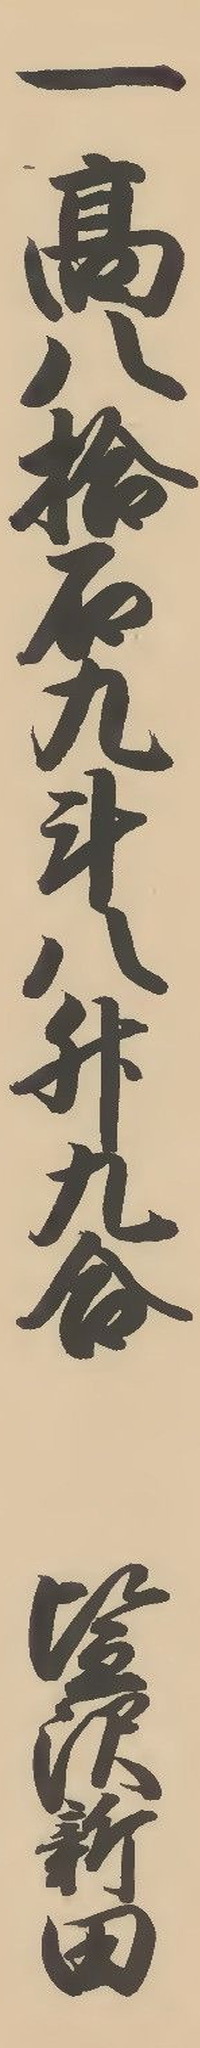一髙八拾石九斗八升九合塩沢新田
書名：上野国郷帳
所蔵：国立公文書館 National Archives of Japan
